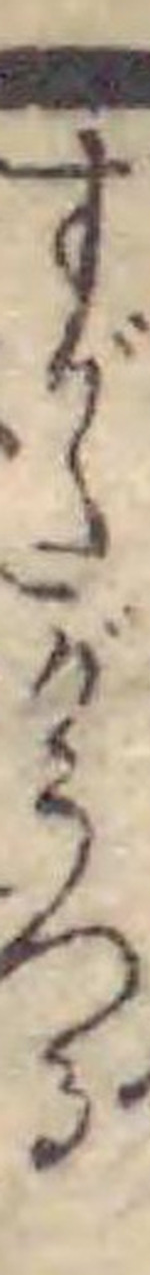すがたがうつる
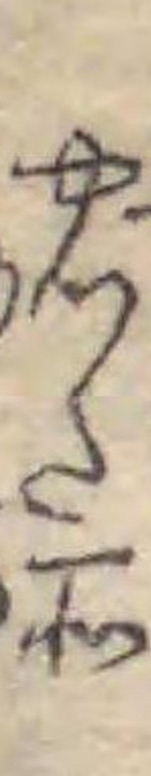やつた所
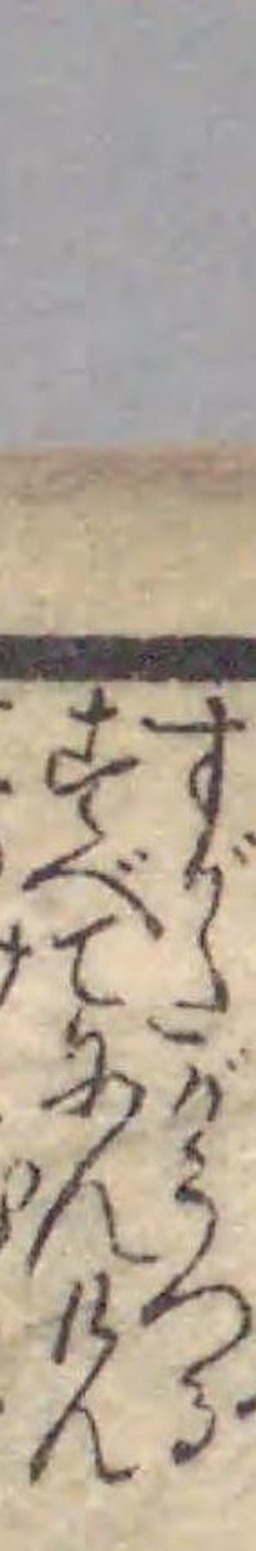すべてにんけん
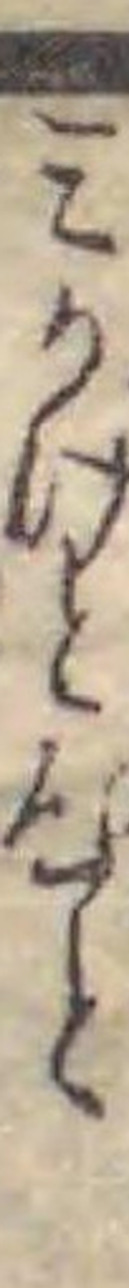みかけと心と
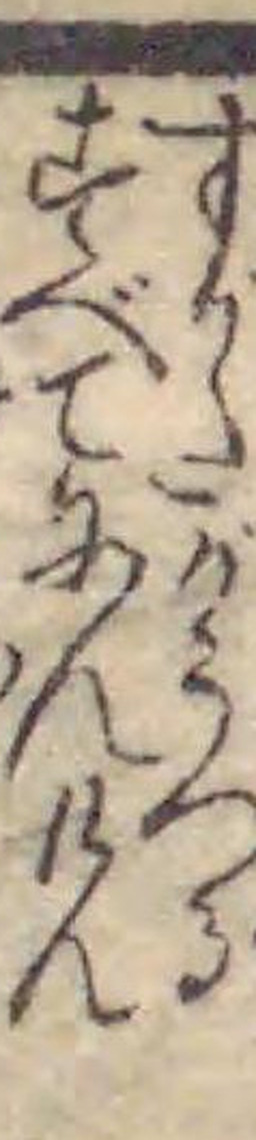すべてにんけん
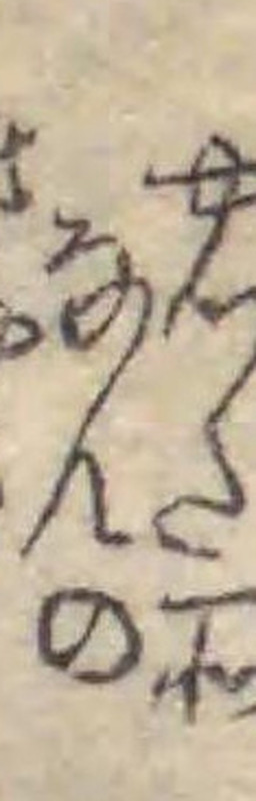なんの
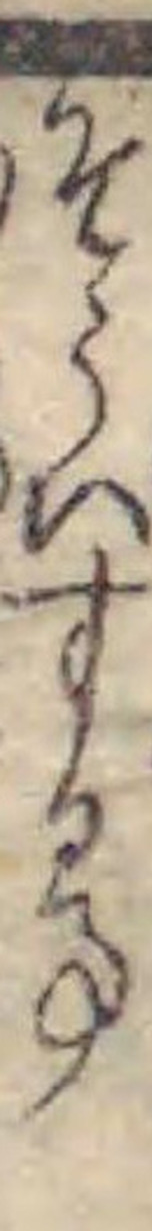そういする事
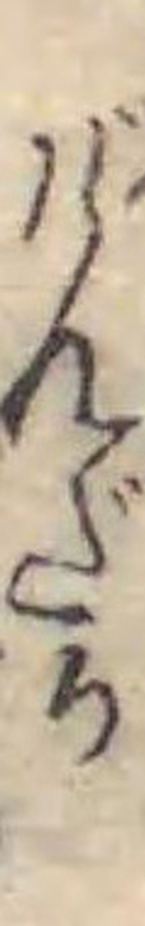げんだか
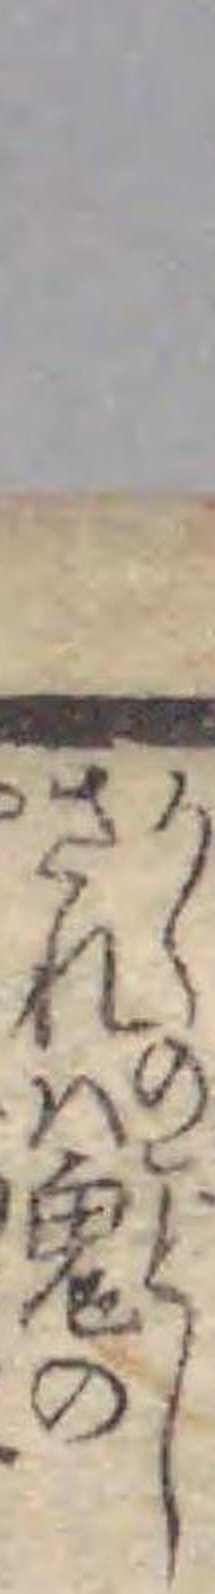されは鬼の
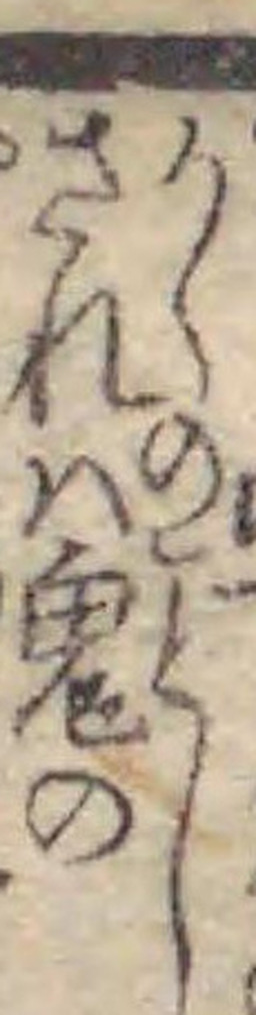されは鬼の
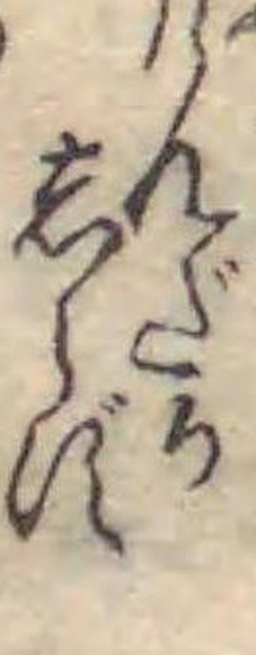しらず
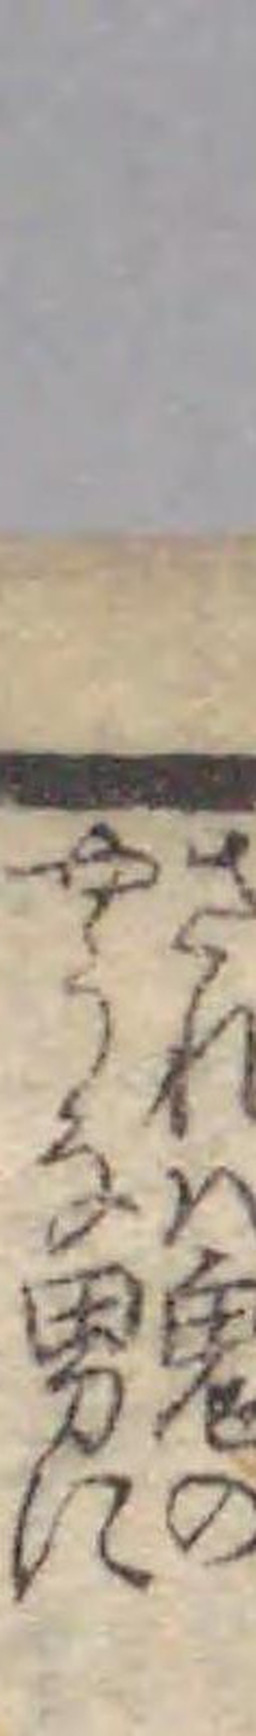やうな男に
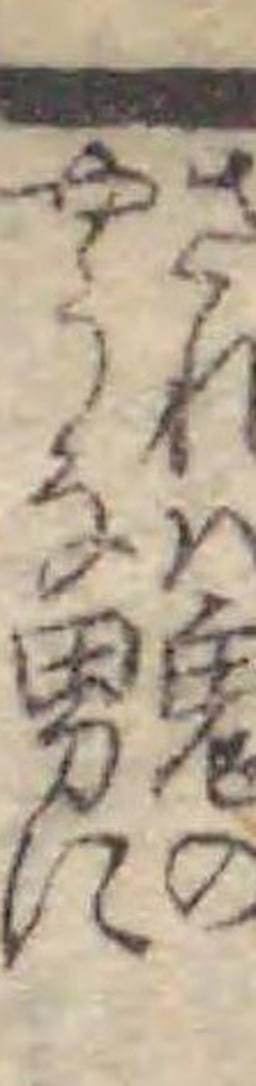やうな男に
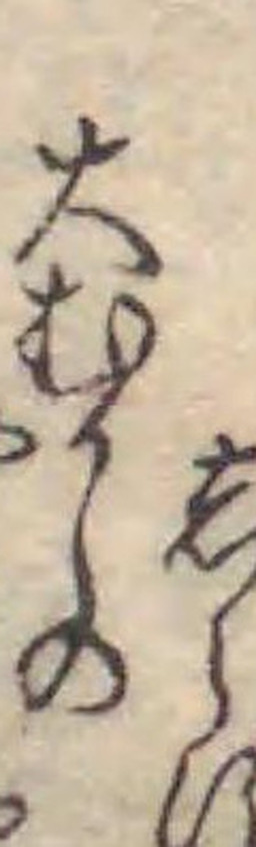大むかしの
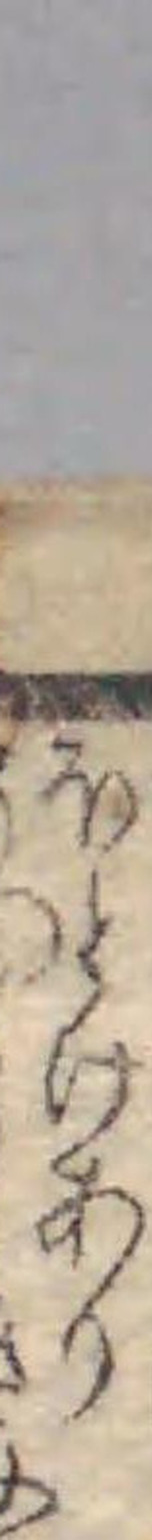ほとけあり
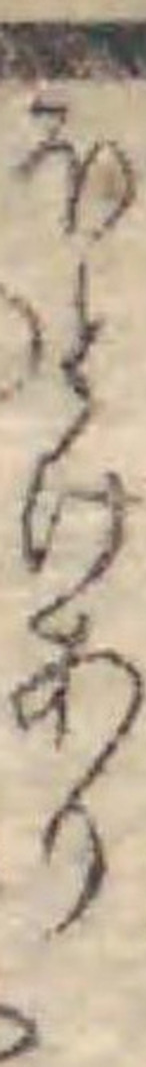ほとけあり
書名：人心鏡写絵 : 3巻
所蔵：国立国会図書館 National Diet Library, JAPAN
